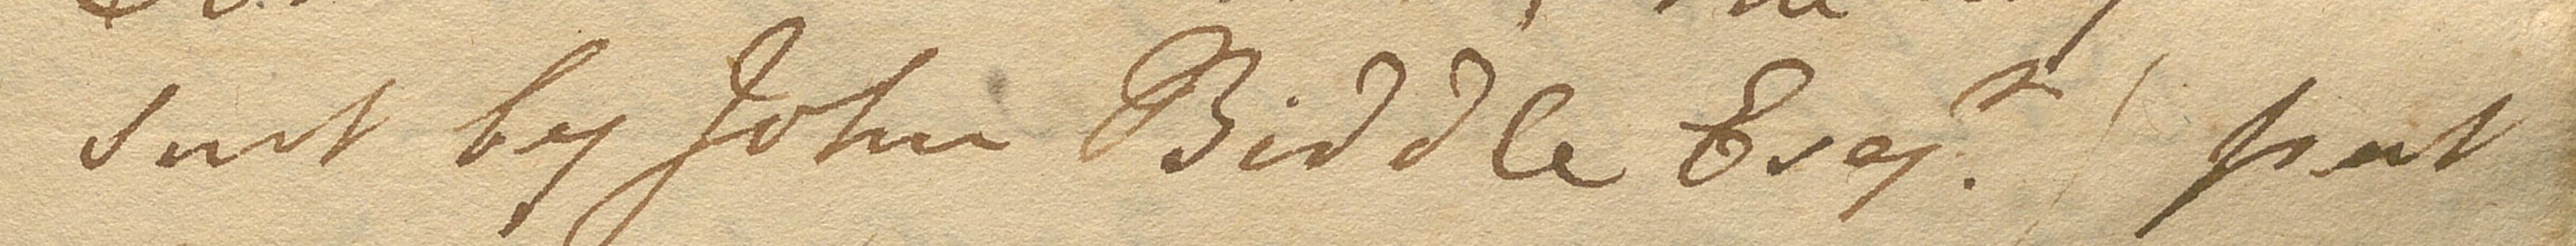sent by John Biddle Esq^r. put
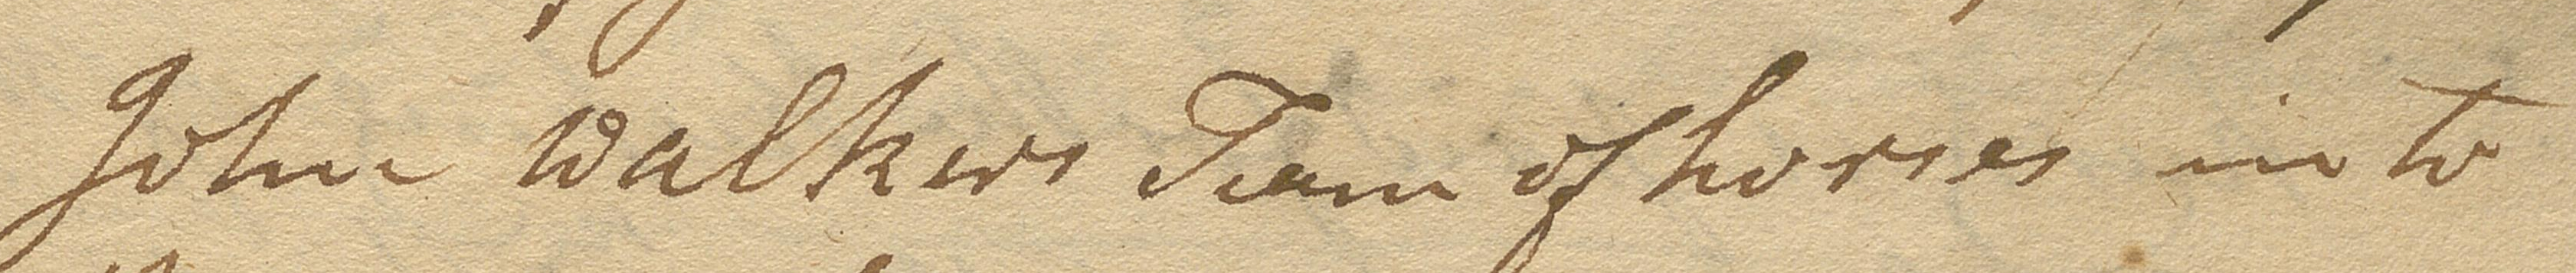John walkers Team of horses in to
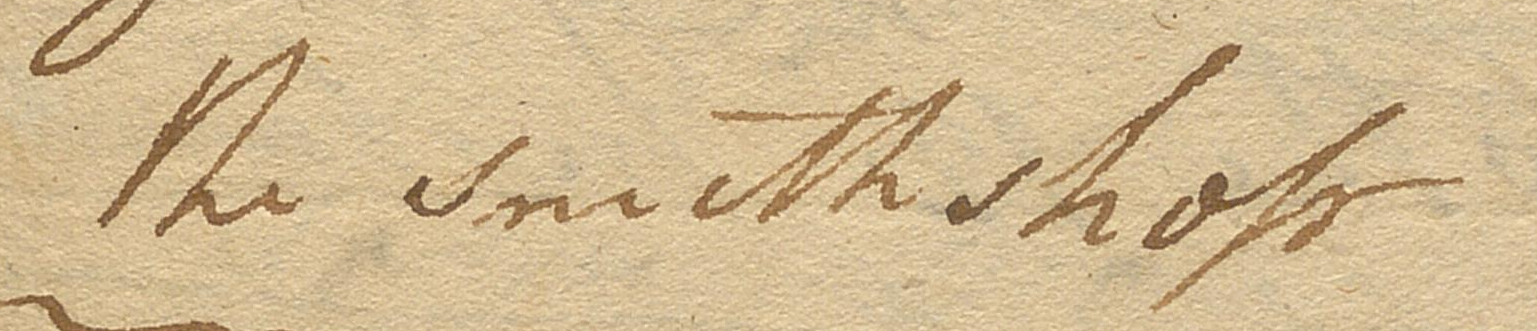the smith shop
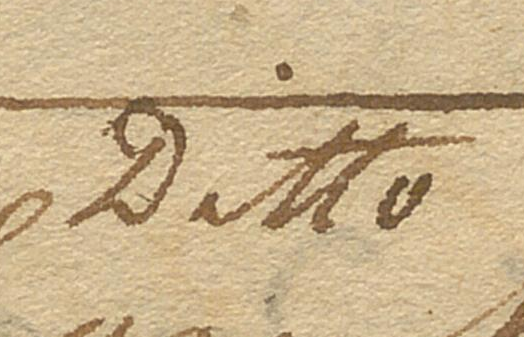Ditto
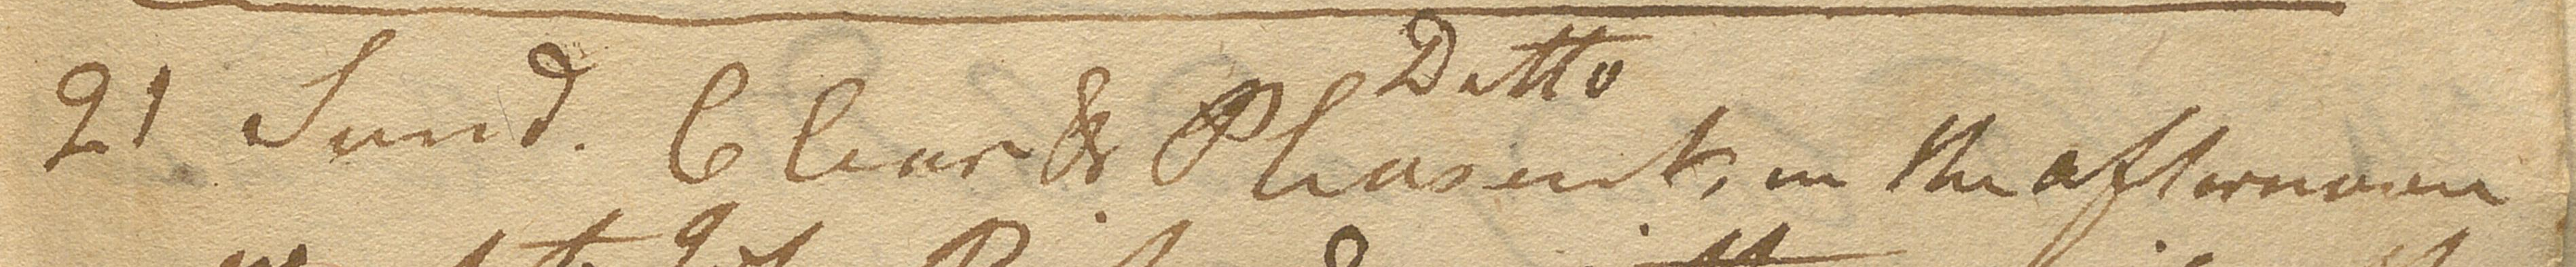21 Sund. Clear & Pleasent, in the afternoon
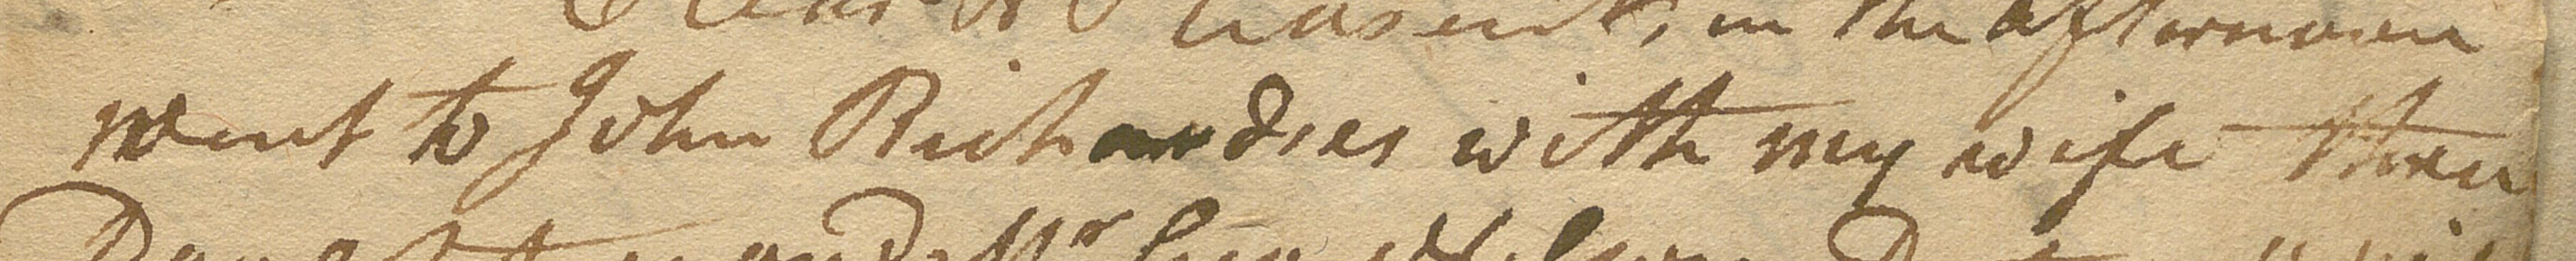went to John Richardses with my wife three
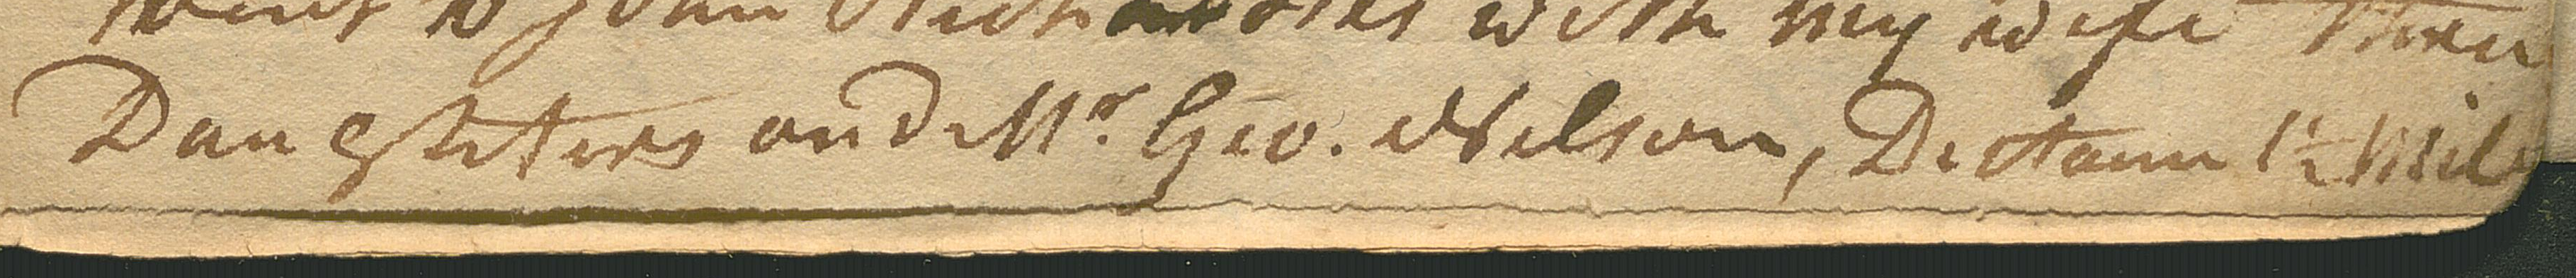Daughters and M^r. Geo. Nelson, Distance 1 1/2 Mile
